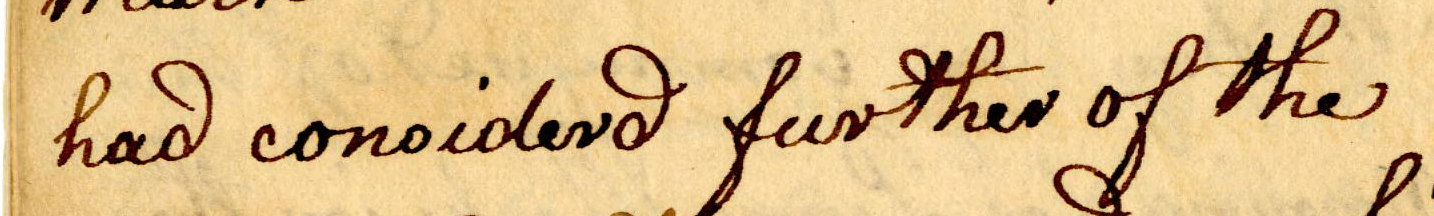had considered further of the
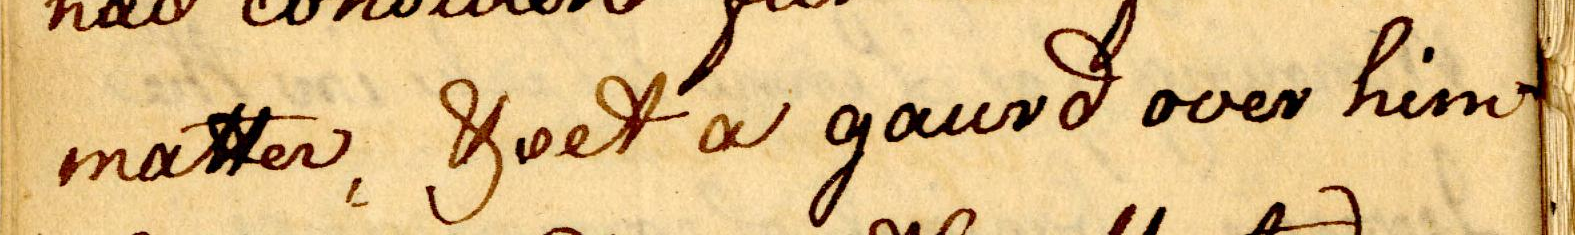matter, & set a gaurd over him
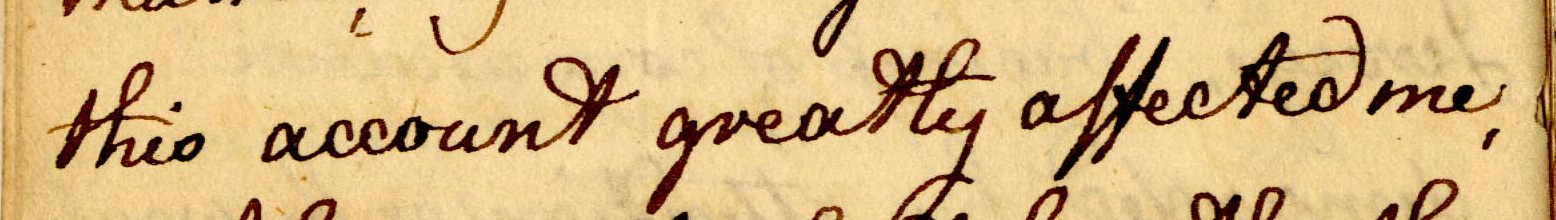this account greatly affected me,
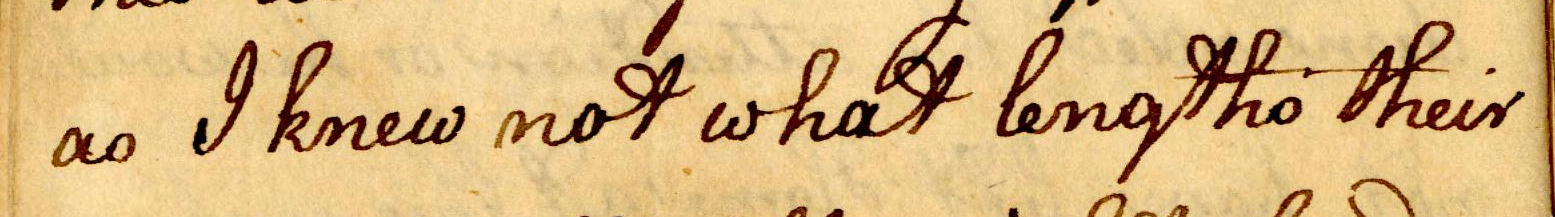as I knew not what lengths their
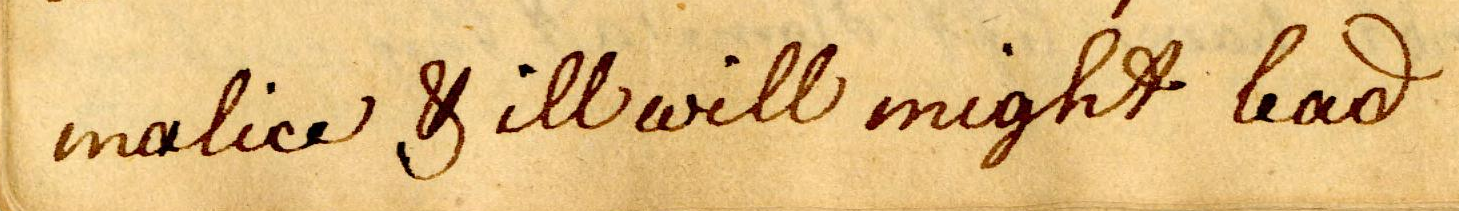malice & ill will might lead
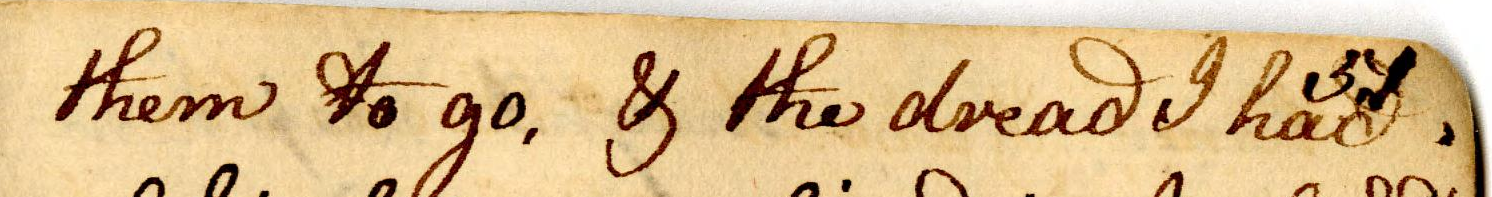them to go, & the dread I had
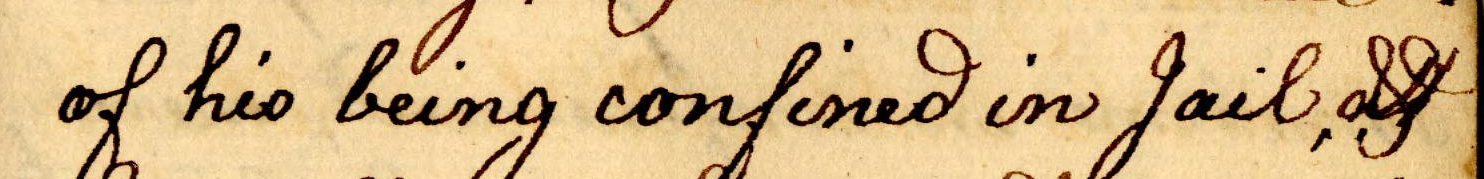of his being confined in Jail, [_]
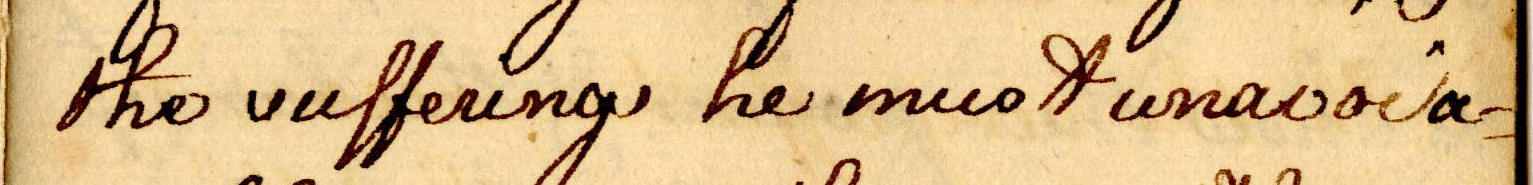the sufferings he must unavoia-
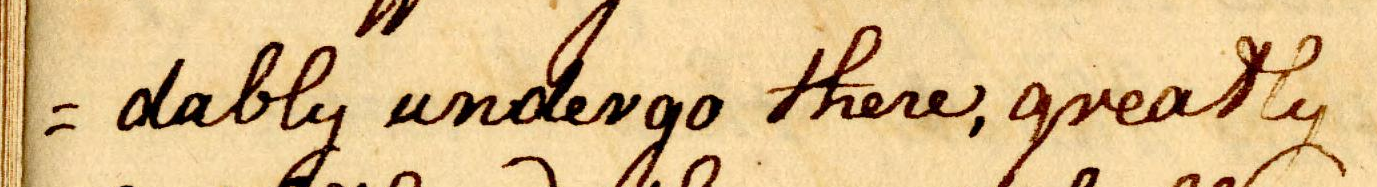-dably undergo there, greatly
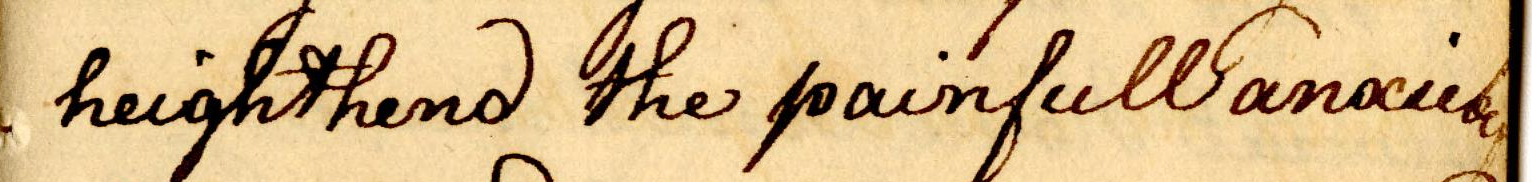heightend the painfull anxiety
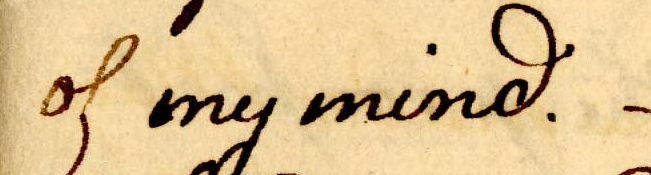of my mind.-
